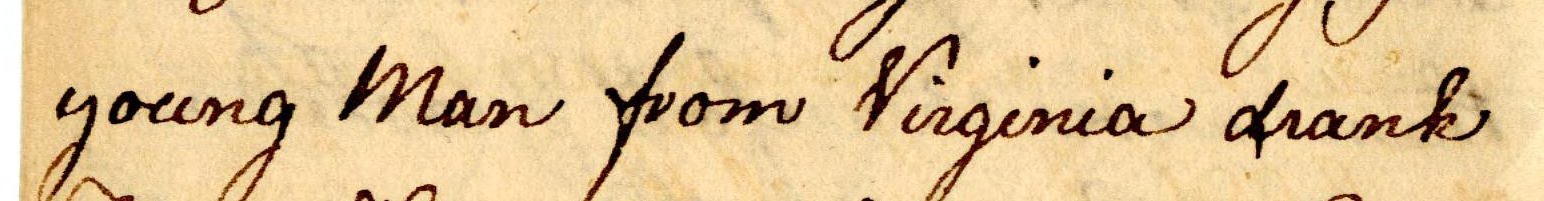young Man from Virginia drank
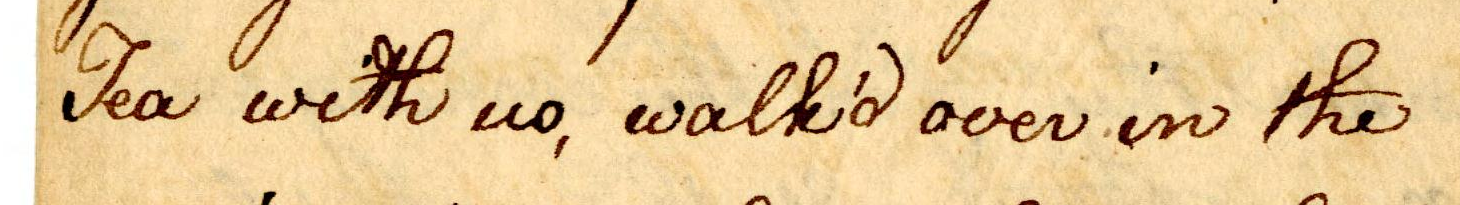Tea with us, walk'd over in the
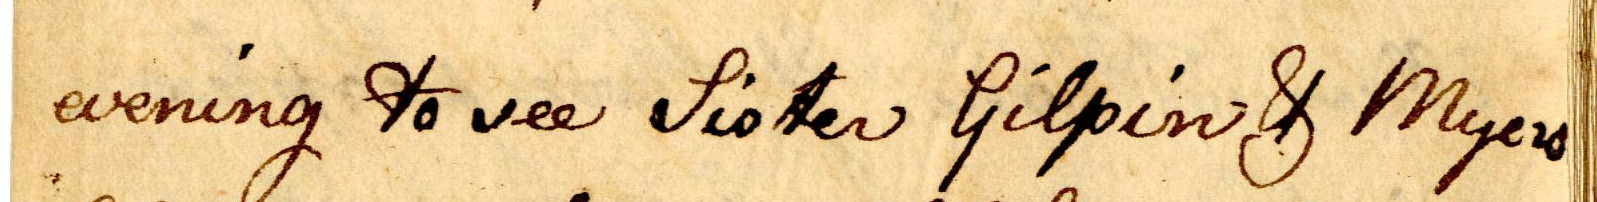evening to see Sister Gilpin & Myers
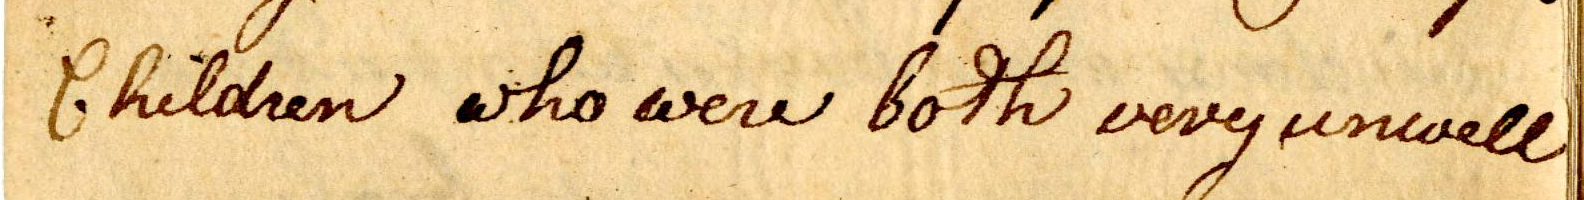Children who were both very unwell
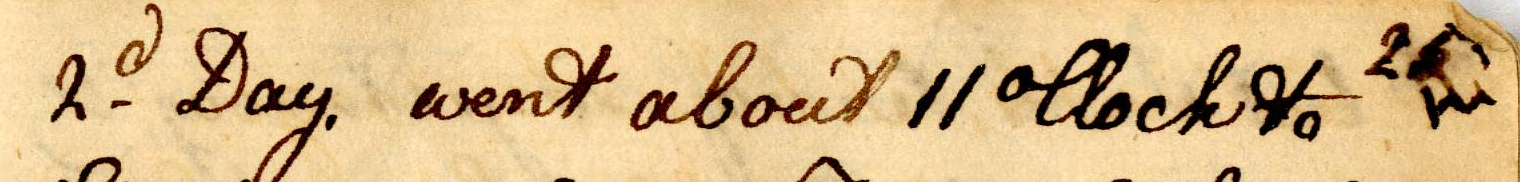2^d Day. went about 11 ^o Clock to
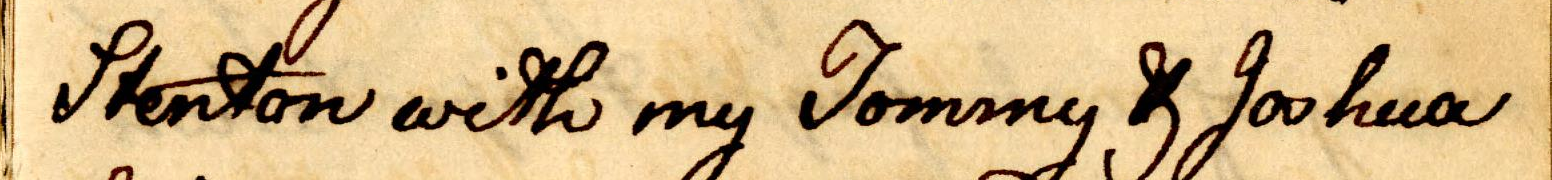Stenton with my Tommy & Joshua
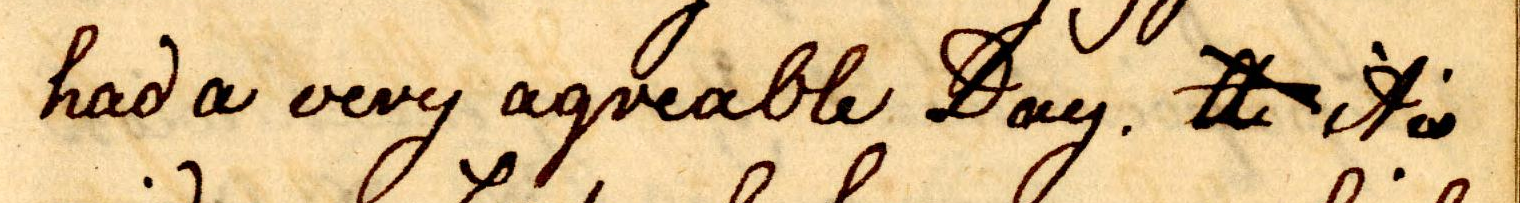had a very agreable Day. [A] it is
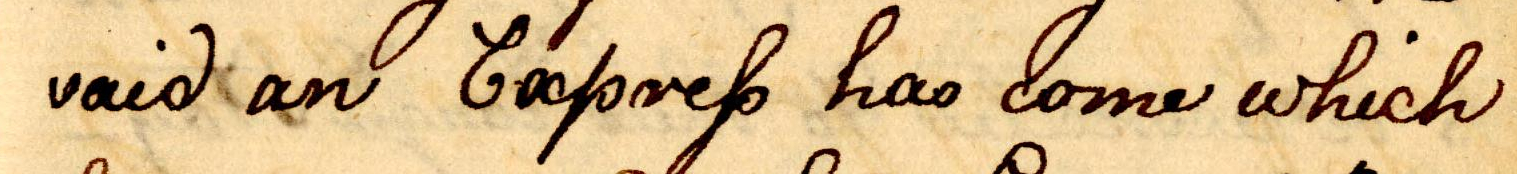said an Express has come which
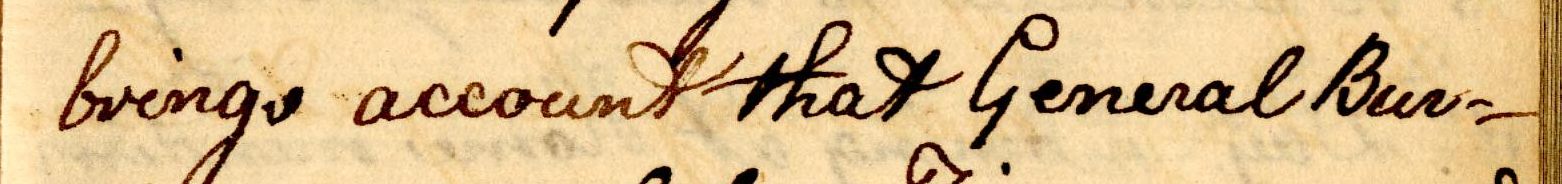brings account that General Bur-
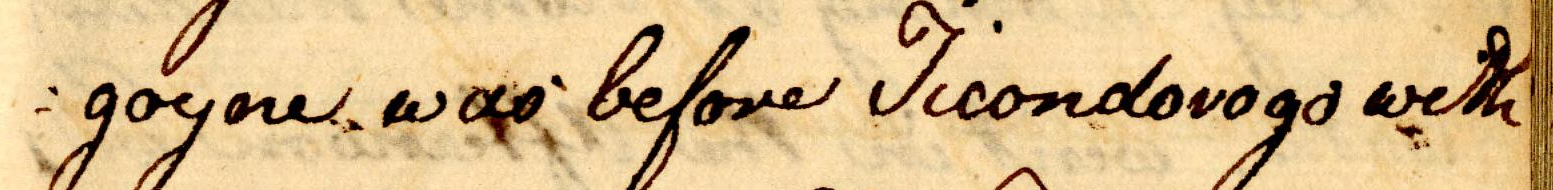-goyne was before Ticondoroga with
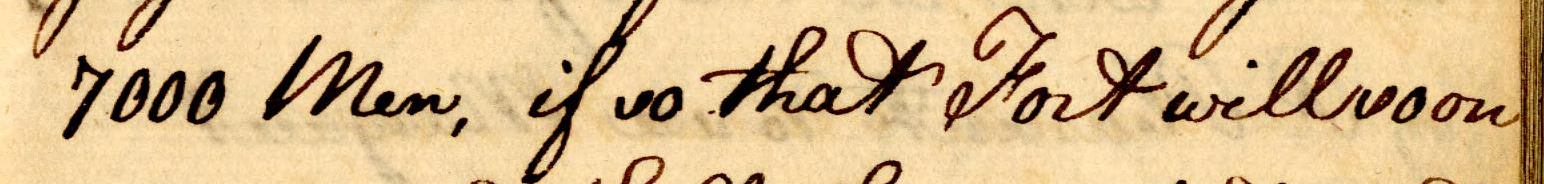7000 Men, if so that Fort will soon
